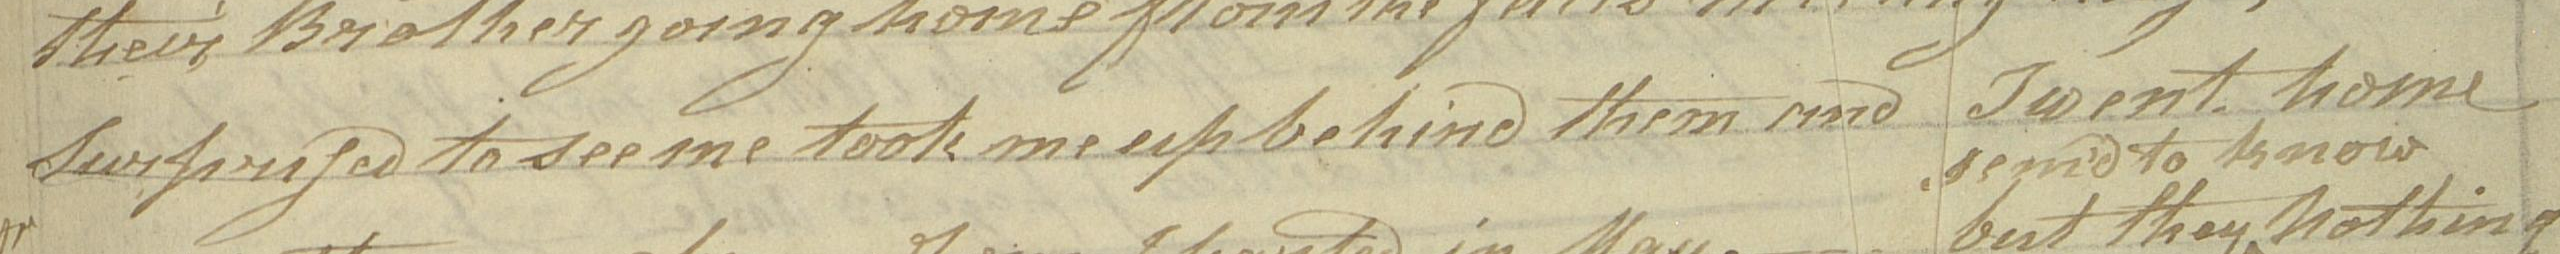surprised to see me took me up behind them and I went home
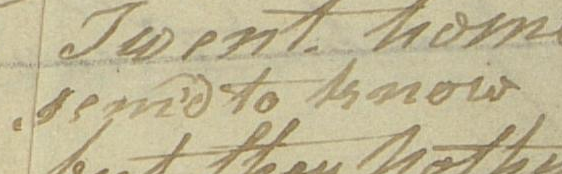sem'd to to know
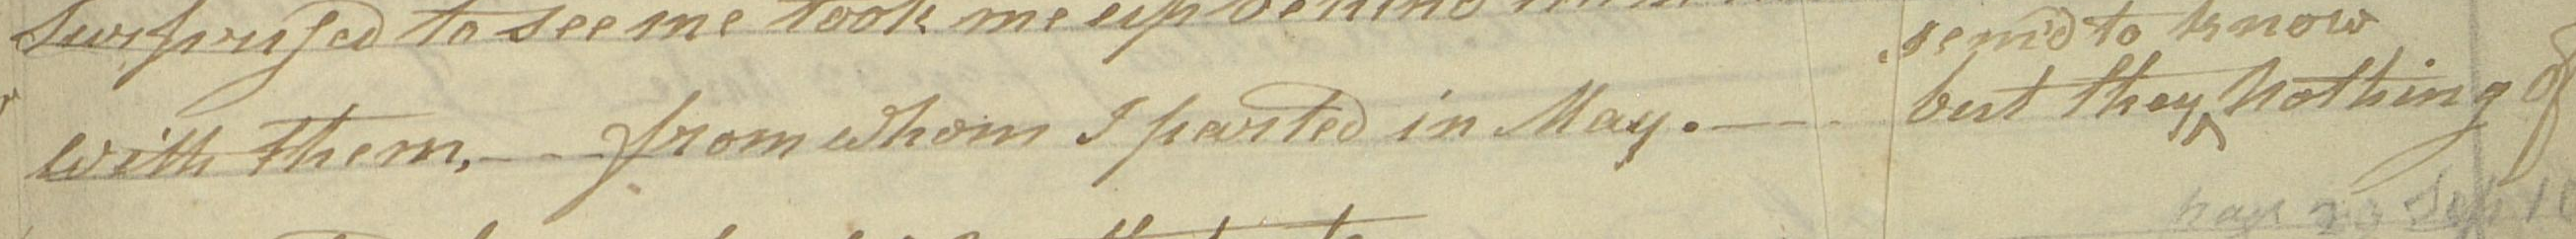with them, from whom I parted in May. but they ^ nothing of
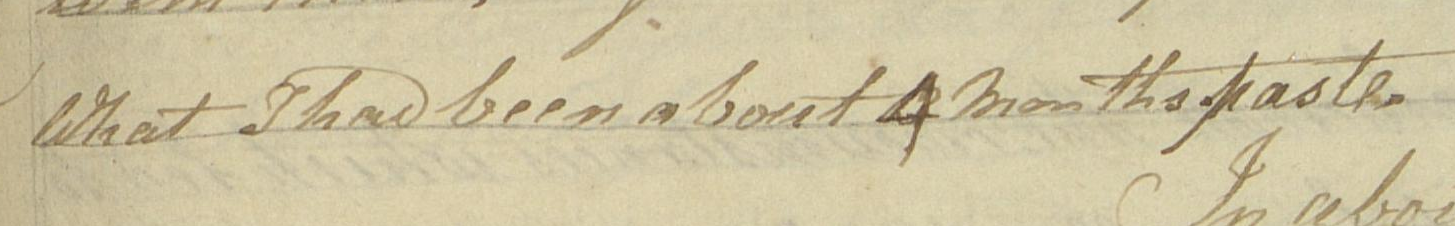what I had been aboust 4 months past
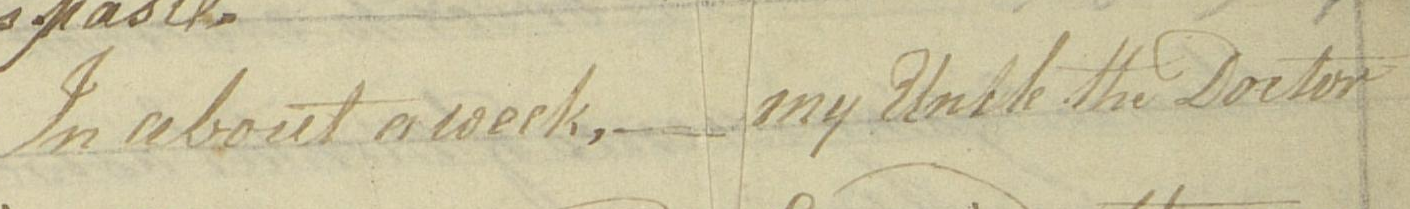In about a week, my Uncle the Doctor
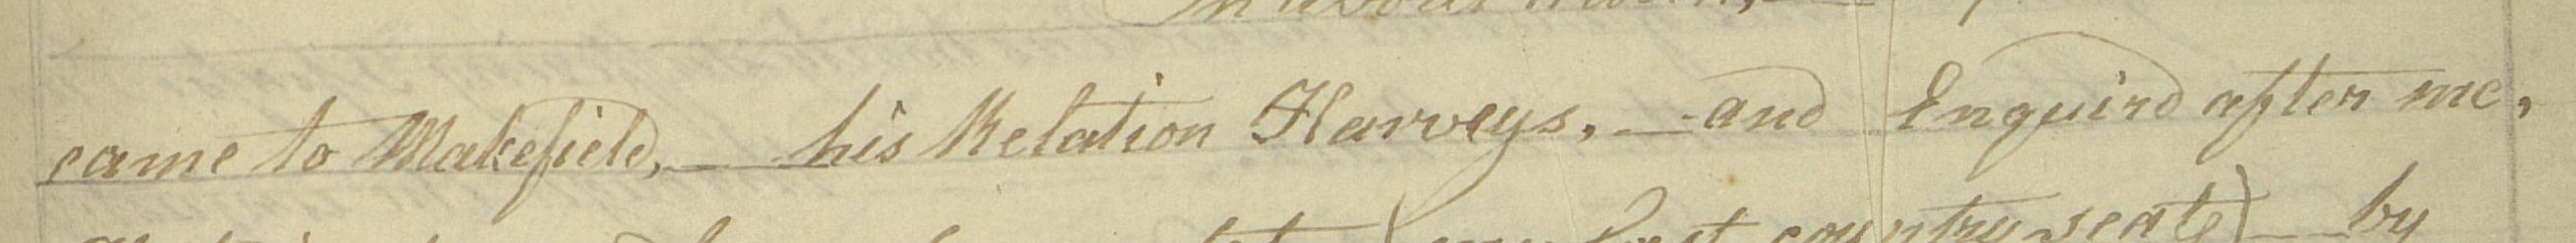came to Makefield, his Relation Harveys, and Enquird after me.
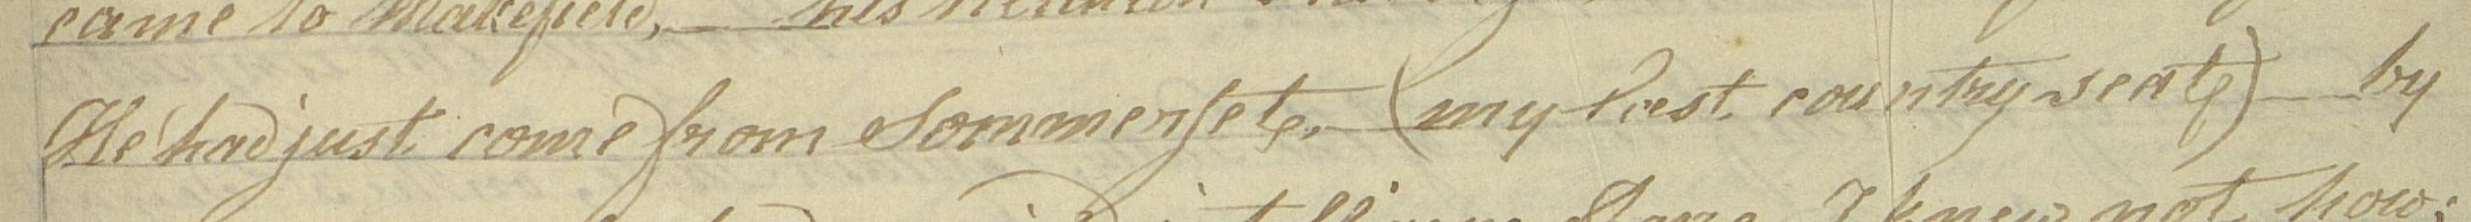He had just come from Sommerset (my last country seat) by
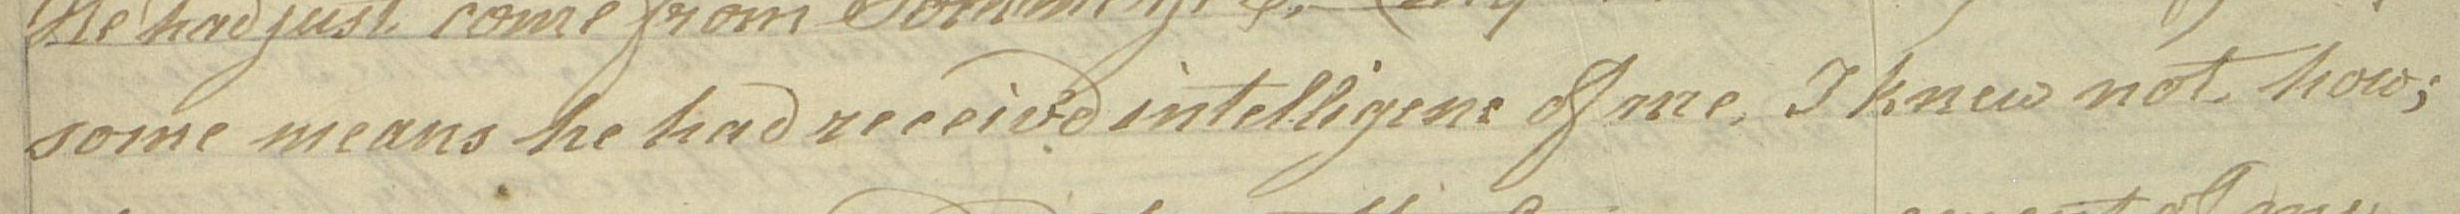some means he had receiv'd intelligenc of me I knew not how;
